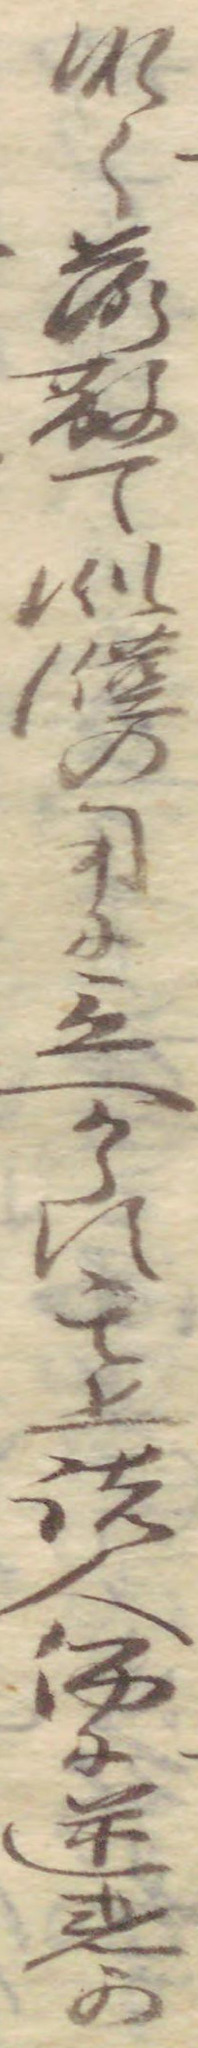なく落散て飢饉の用に立へからす其上諸人酒に迷惑可
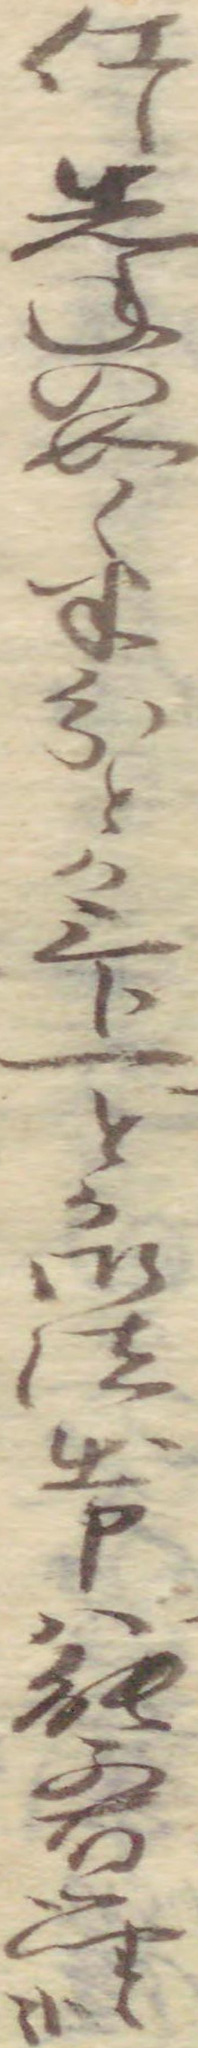仕候先年の如く半分とか三分一とか御法出申は能可有御座候哉
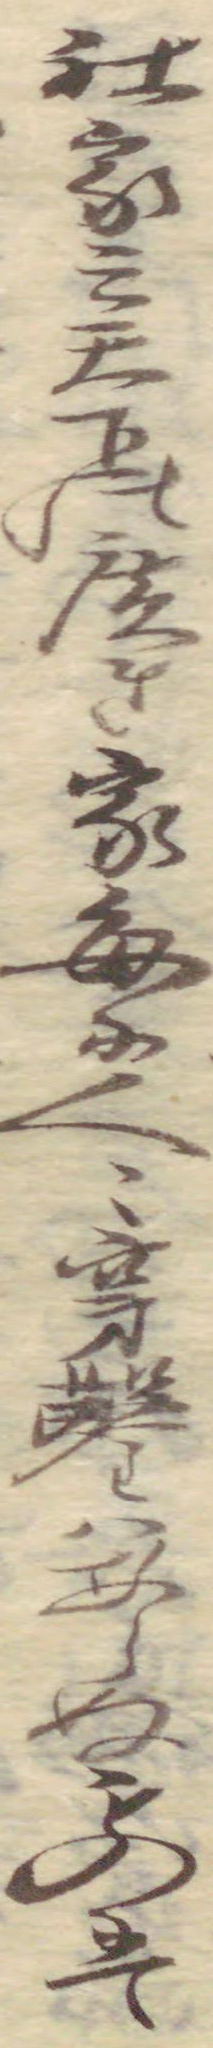社家云天下の広き家毎に人〻穿鑿はならぬものにて
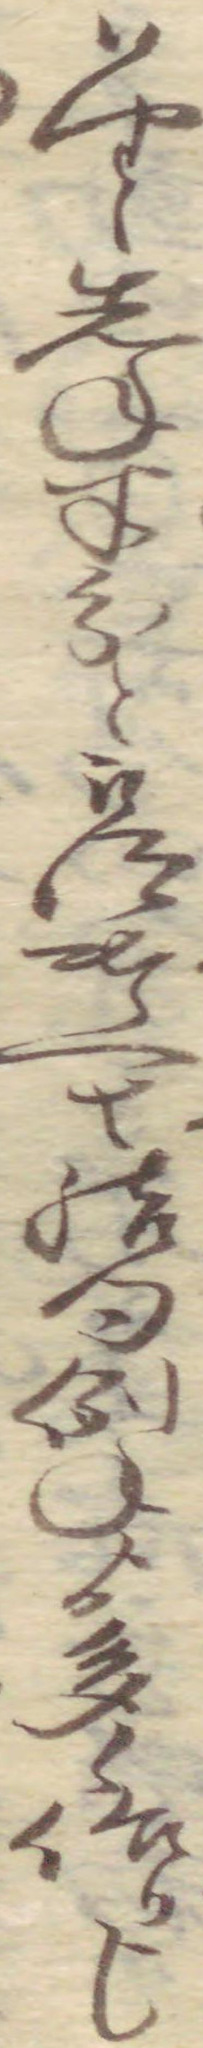御座候先年半分と被仰出候へは結句例年ゟ多く作り申候
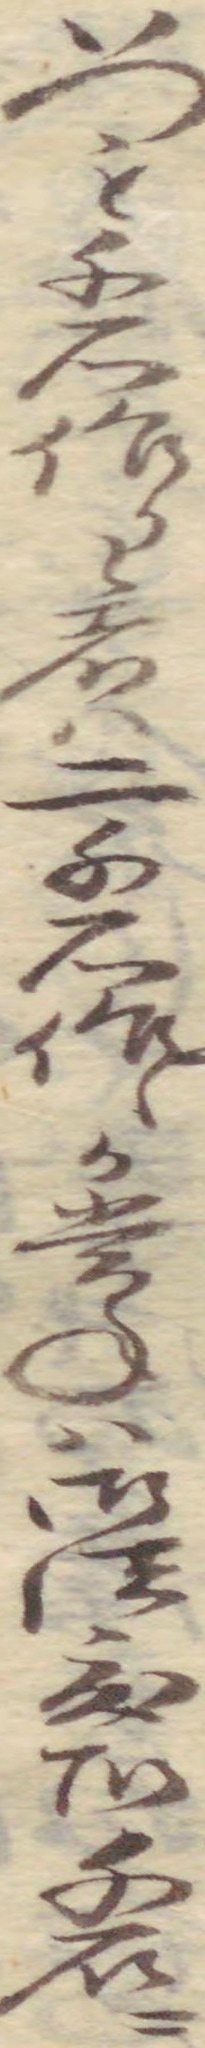いつも千石作り候者は二千石作候か当年は御法度故千石ニ
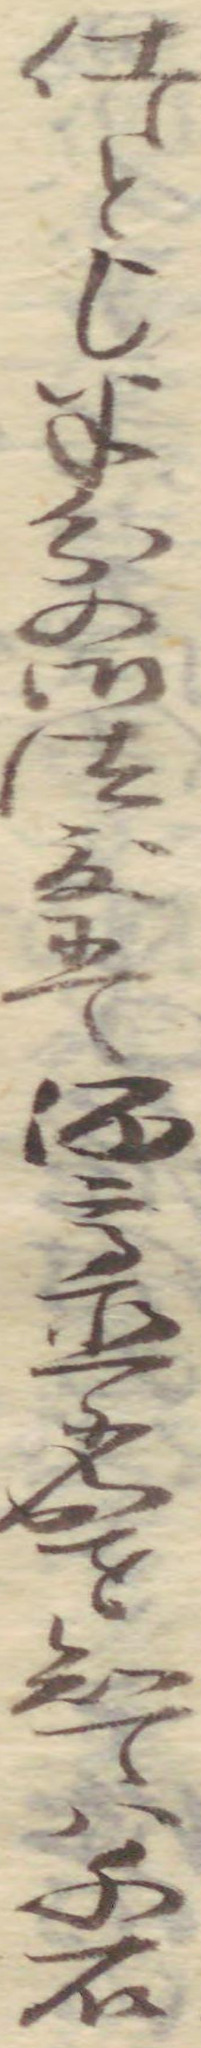仕候と申候半分の御法度にて酒高直に成を知ては千石
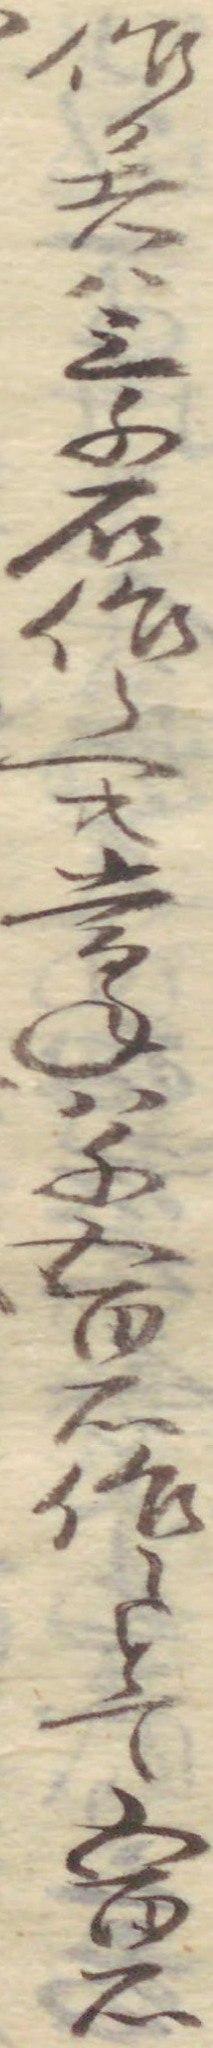作る者は三千石作候へ共当年は千五百石作候とて五百石
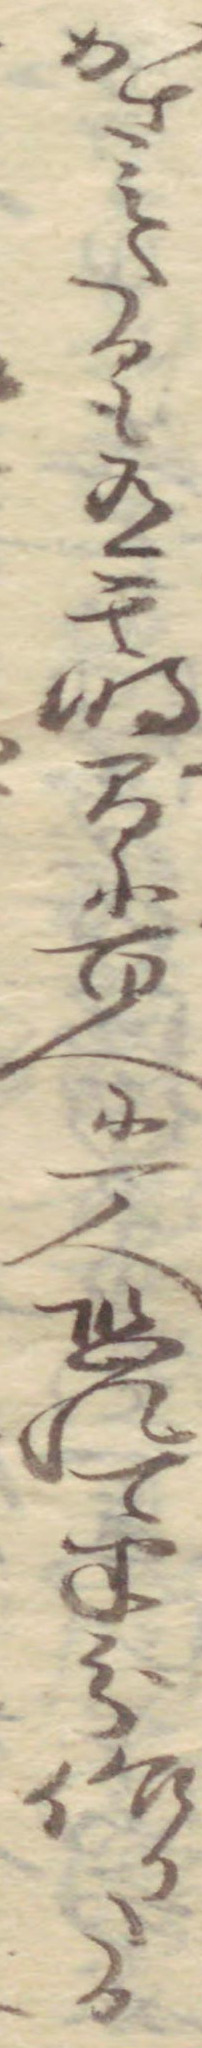かさみたるも有其時間に百人に一人恐れて半分作りたる
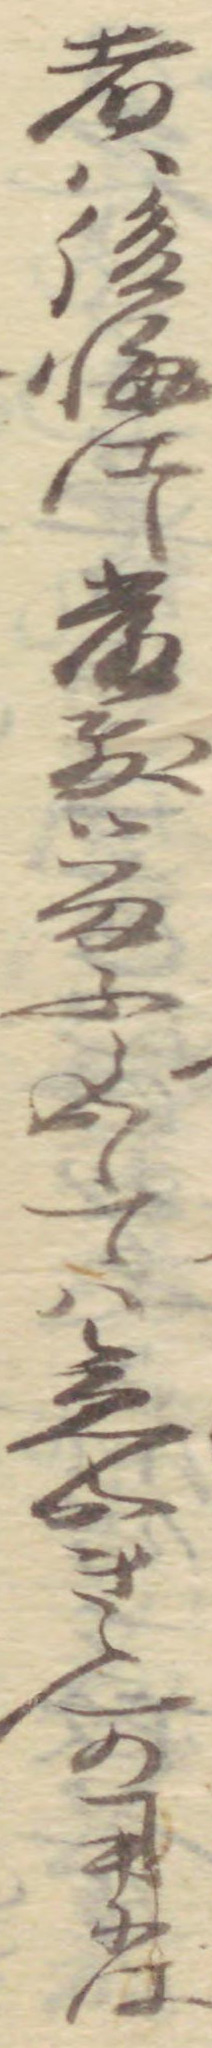者は後悔仕候厳敷御留不成候ては急成きゝんの用には
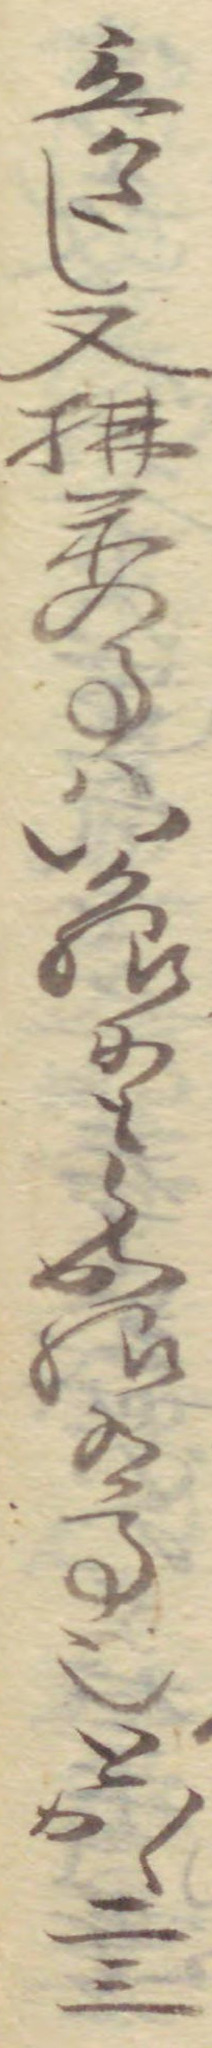立かたし又払米の事はいか様にも被成様有事也とかく二三
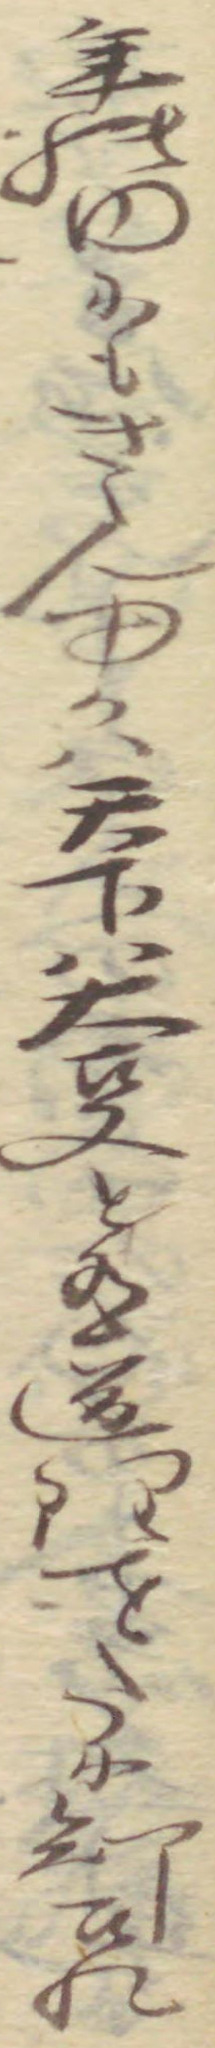年の内にもきゝんゆかは天下は大事と有道理をたに知し召れ
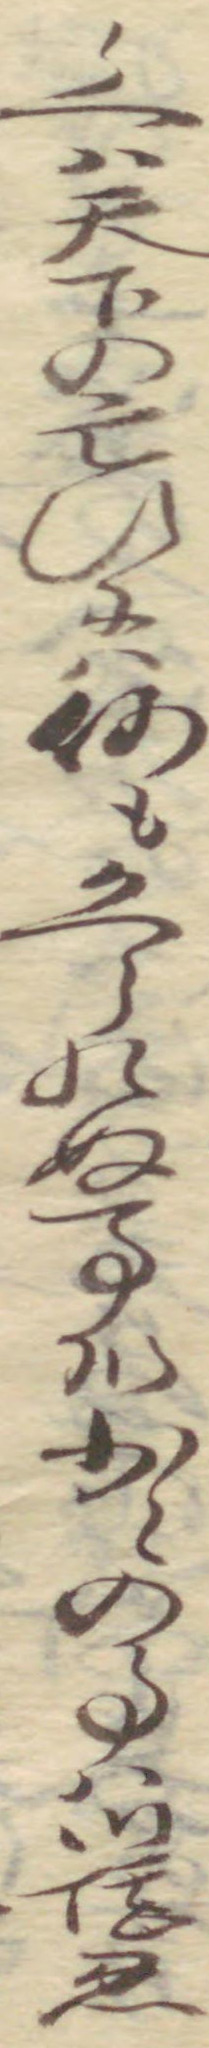候へは天下の亡ひには何もかへられぬ事故少〻の事は御堪忍
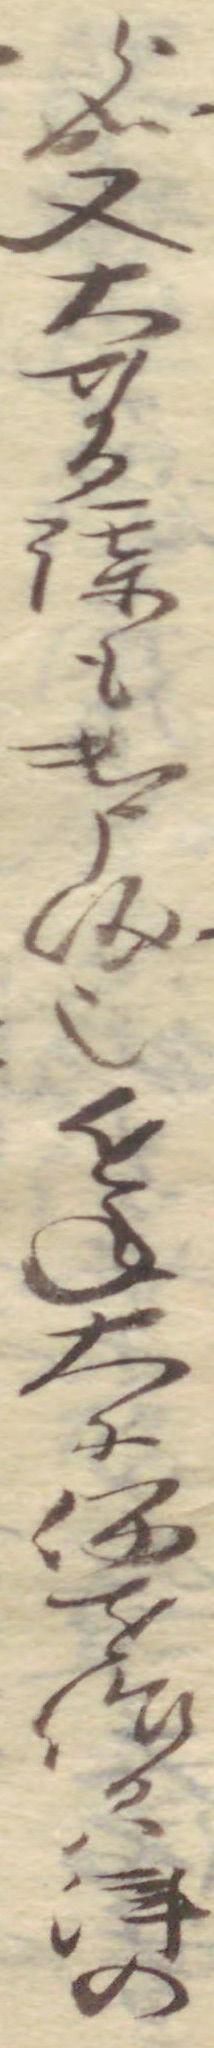被成又大なる謀も出申儀也近年大に酒を作るは津の
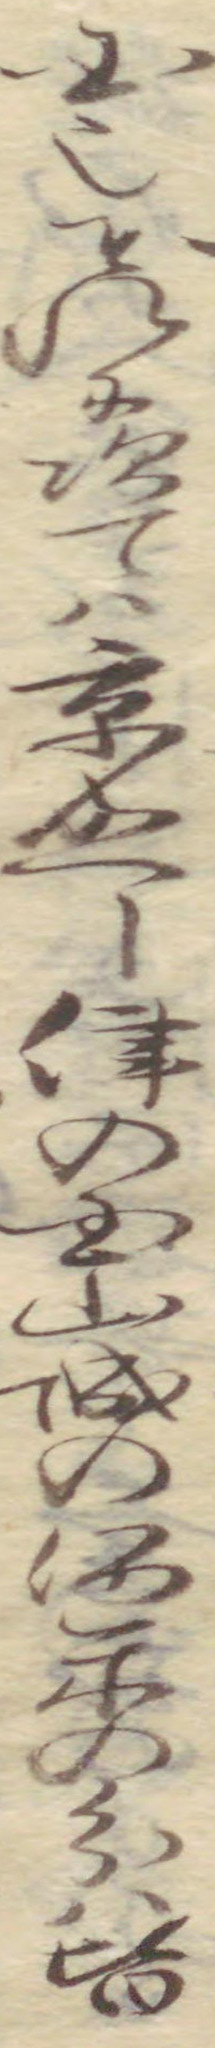国也それに次ては京成へし津の国山城の酒米の分は皆
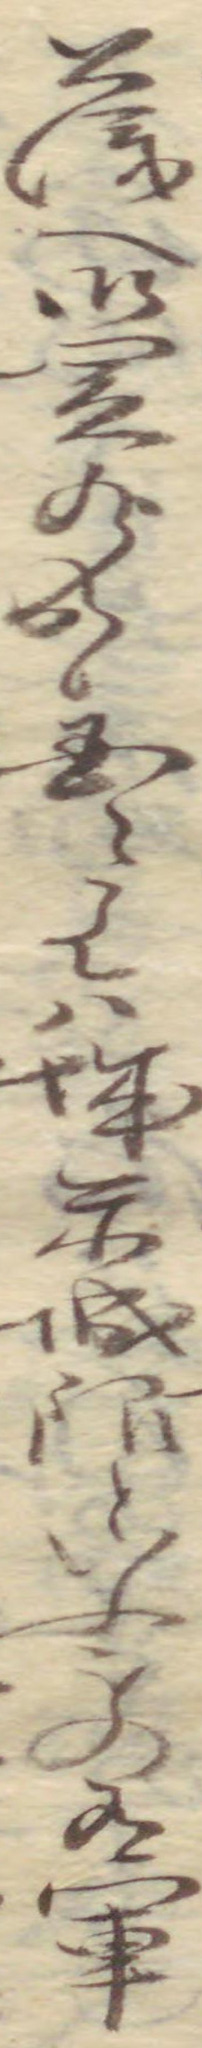公儀へ御買可被成候国〻ニては城米城銀といふもの有軍
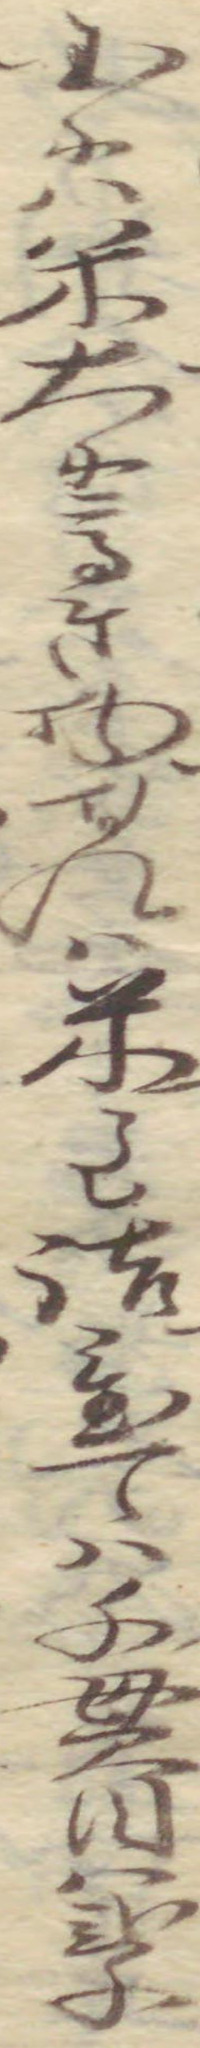国には米大に高き物なれは米ニて詰置ては千貫目は弐千
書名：鶯宿雑記. 巻263-264
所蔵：国立国会図書館 National Diet Library, JAPAN
